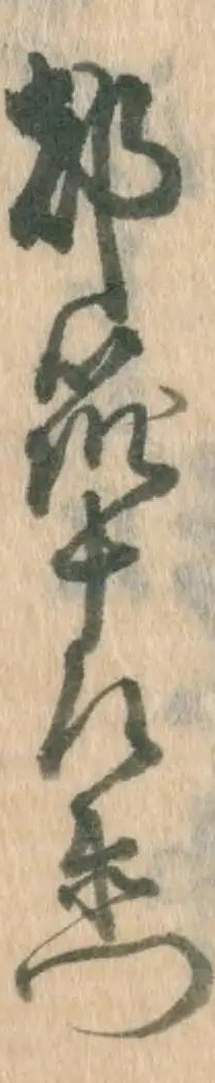六月二十九日都筑十左衛門
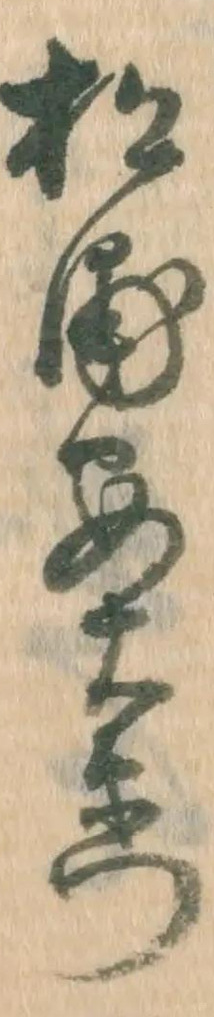松浦安右衛門
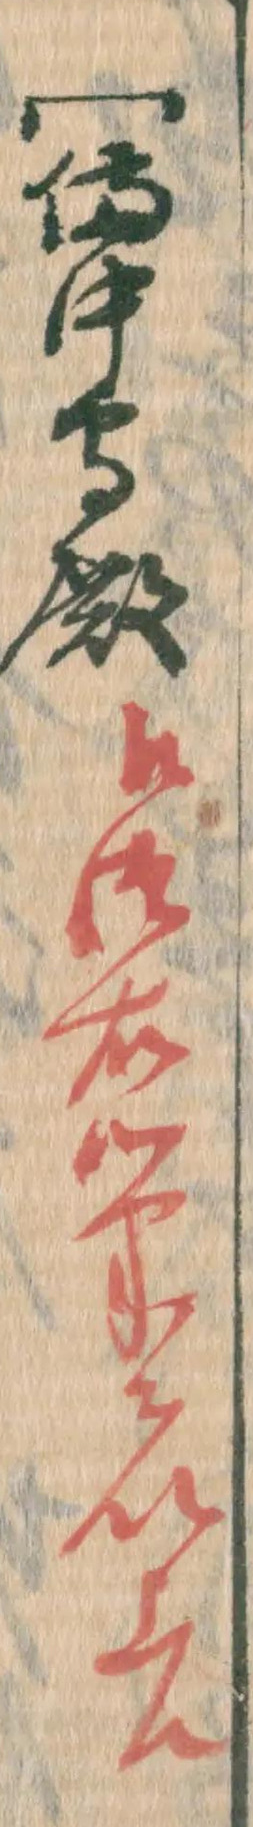│[備中守殿「え御右筆ヲ以上ル」
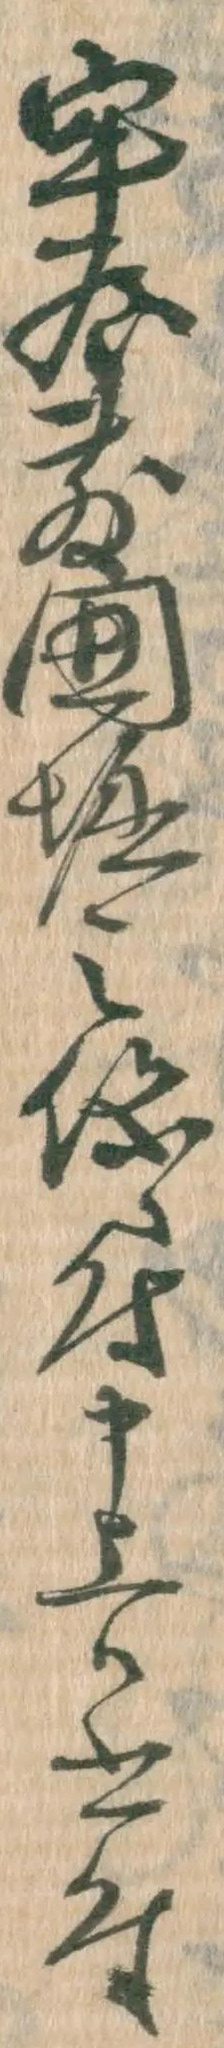│牢屋敷囲堀之儀ニ付茂上候書付
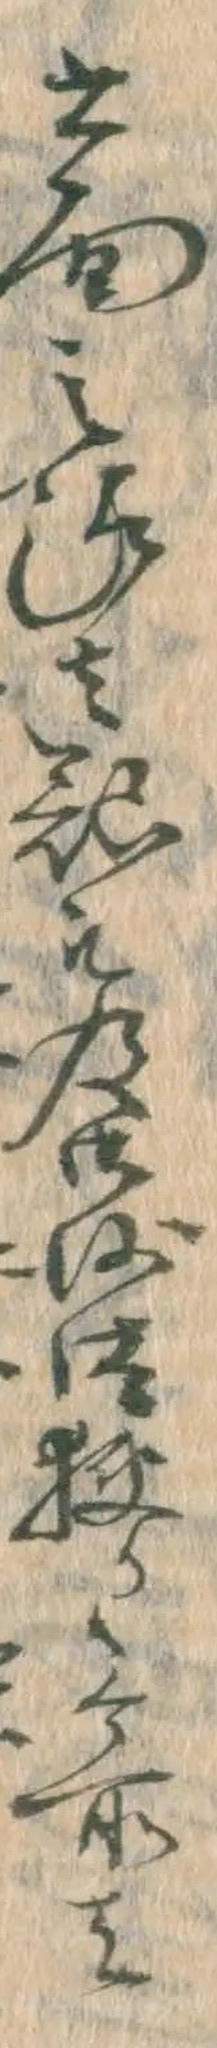│書面之趣は難被及御沙汰損り候ケ所は
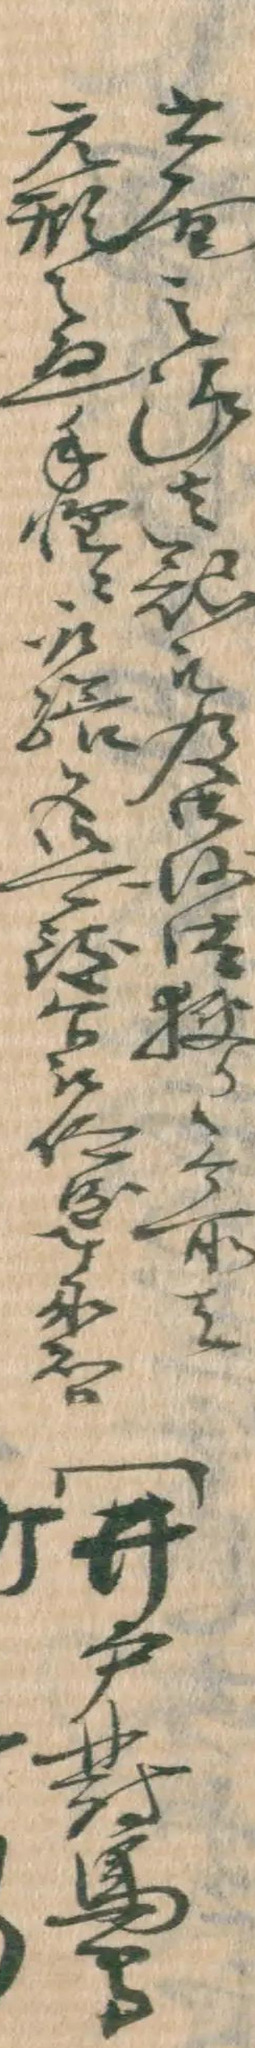│元形之通手軽ニ取繕候様可致旨被仰渡奉承知候井戸対馬守
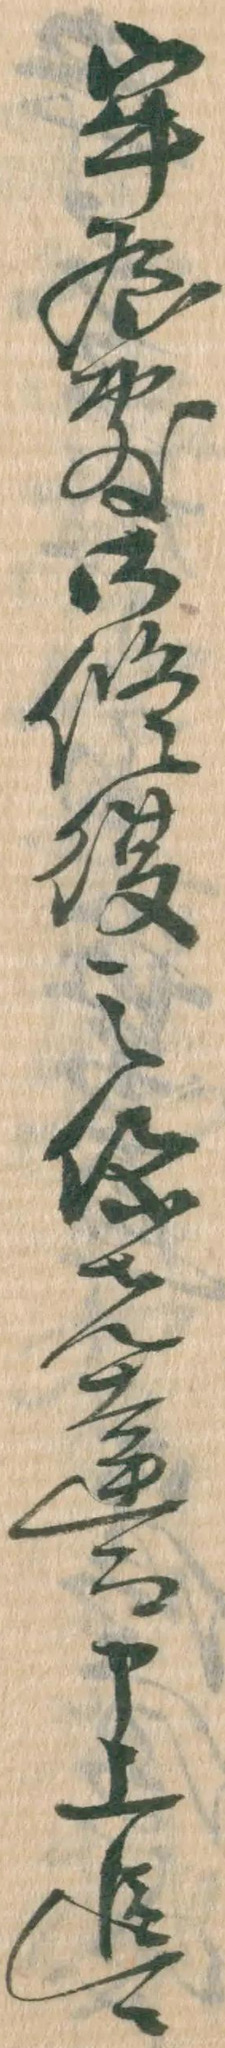牢屋敷御修復之儀先達て申上追〻
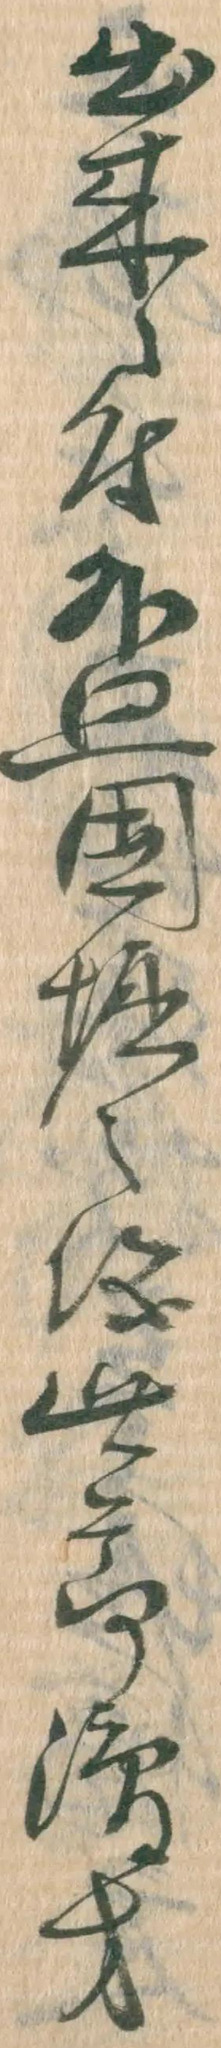出来ニ付外廻囲堀之儀此節浚方

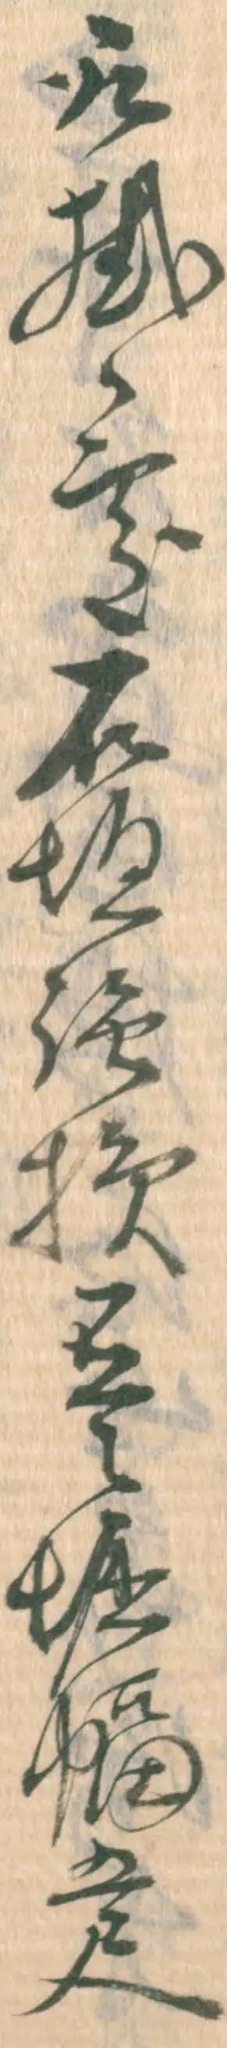取掛候処石垣強損有之堀幅五尺
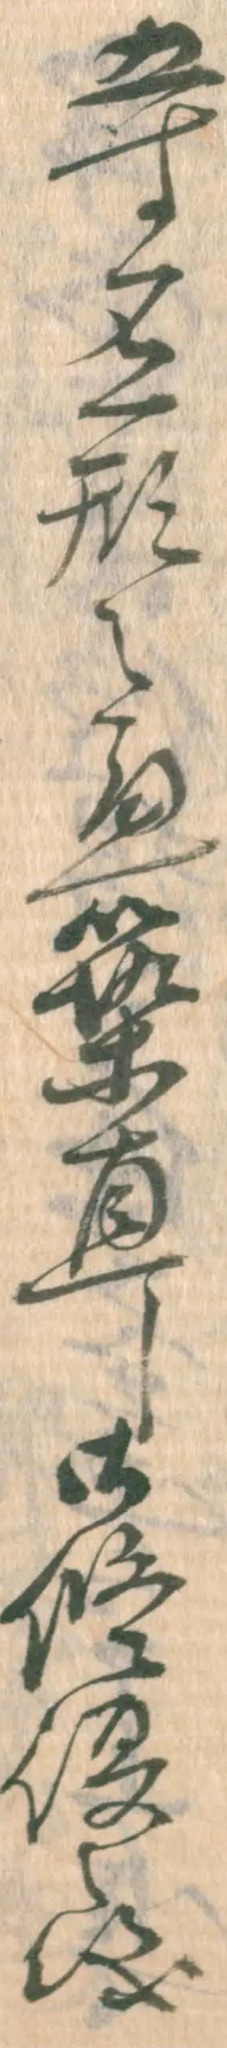五寸有形之通築直し御修復之儀
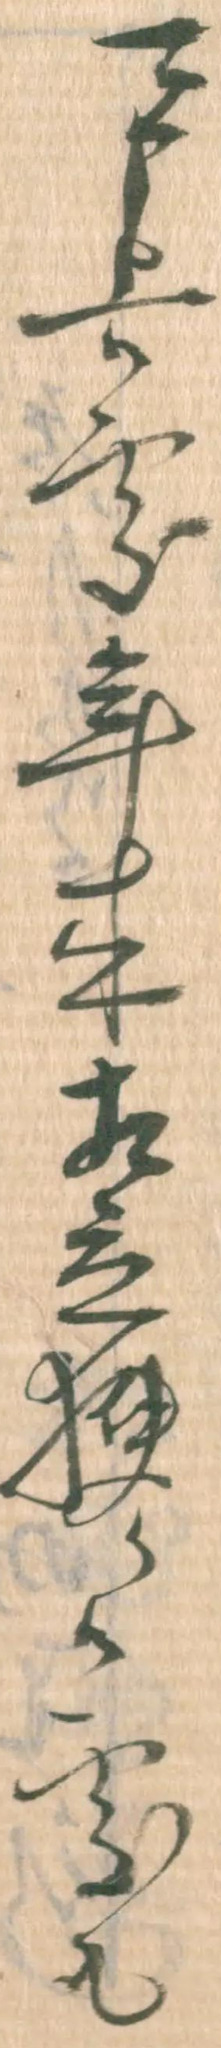可申上候処年来相立損り候処共
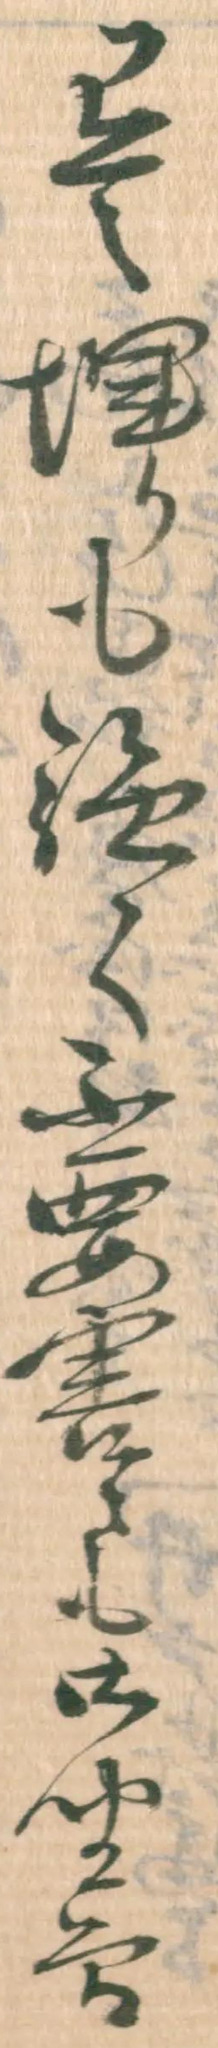有之埋りも強く不要害ニも御座候間
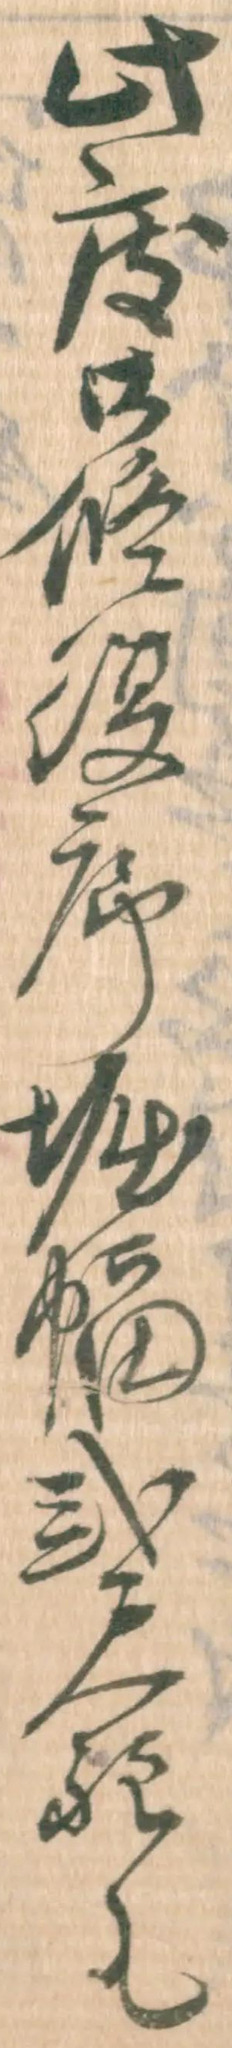此度御修復序堀幅弐三尺程も
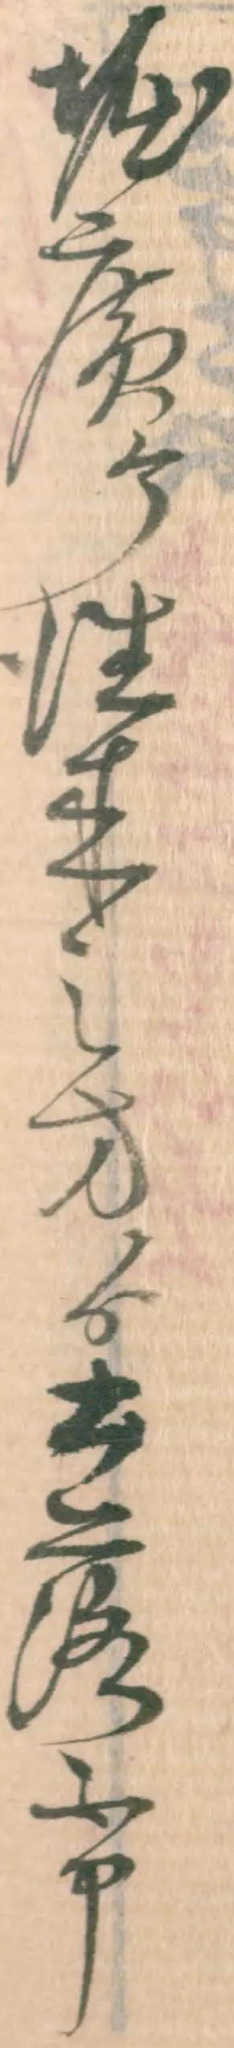堀広ケ往来之方ゟ土落不申
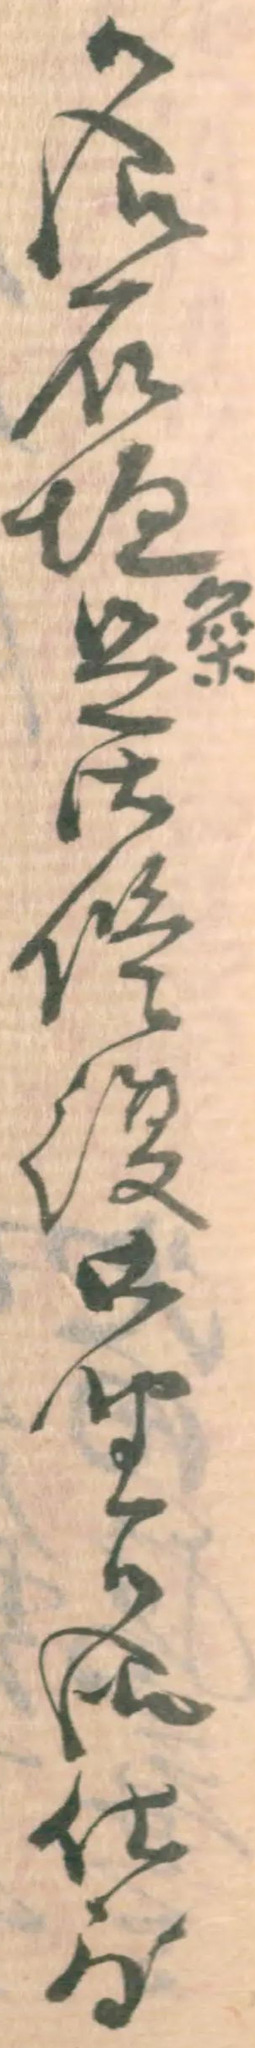候様石垣築足御修復御座候様仕度
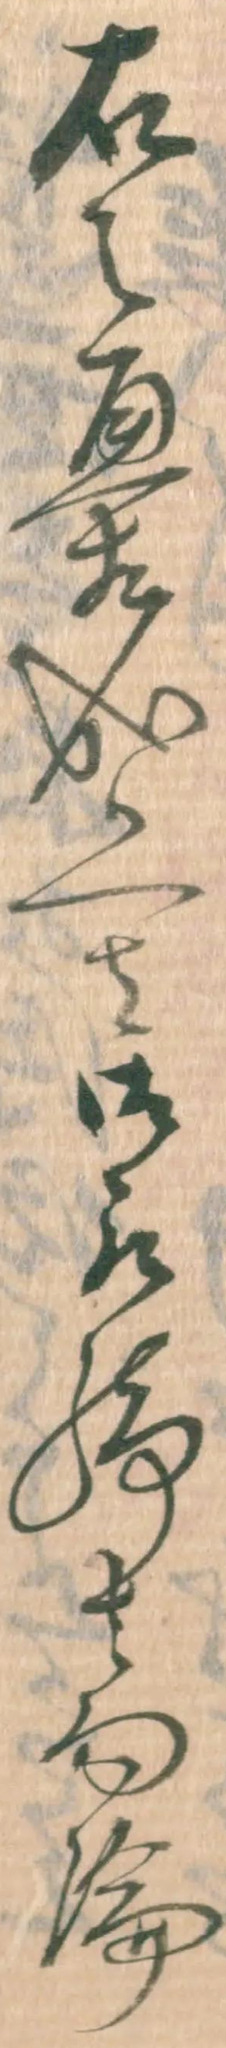右之通相成候へは御取締は勿論
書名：七十冊物類集 71巻. [44] 四十三 牢屋敷御普請御修覆地震ニ付骨折候牢屋掛御褒美之部
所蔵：国立国会図書館 National Diet Library, JAPAN
